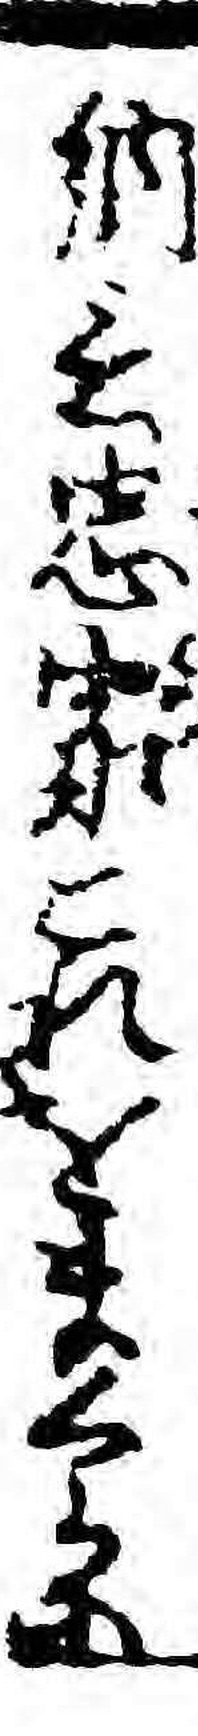納言忠家これをまくらに
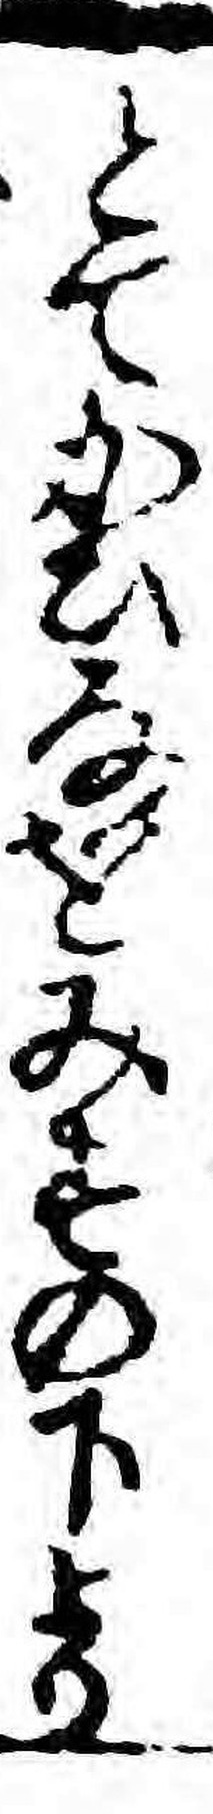とてかひなをみすの下より
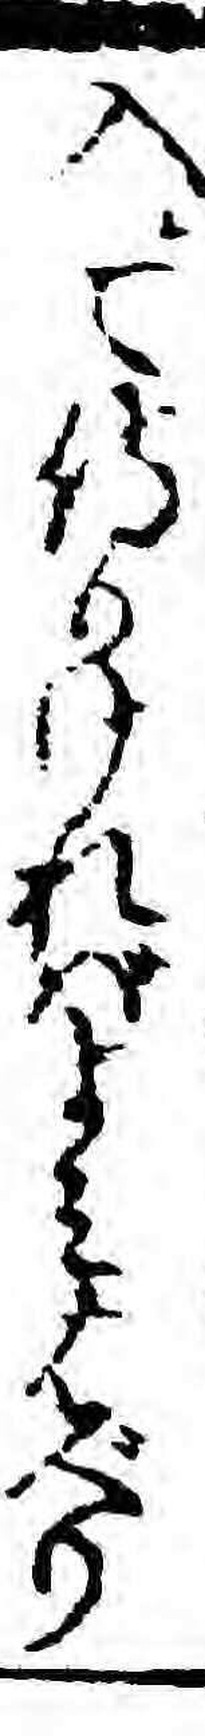入れて侍りければよみはべり
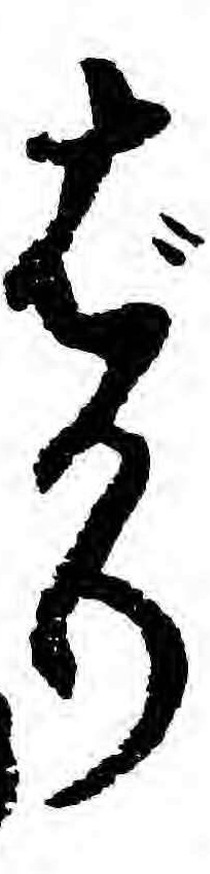ばかり
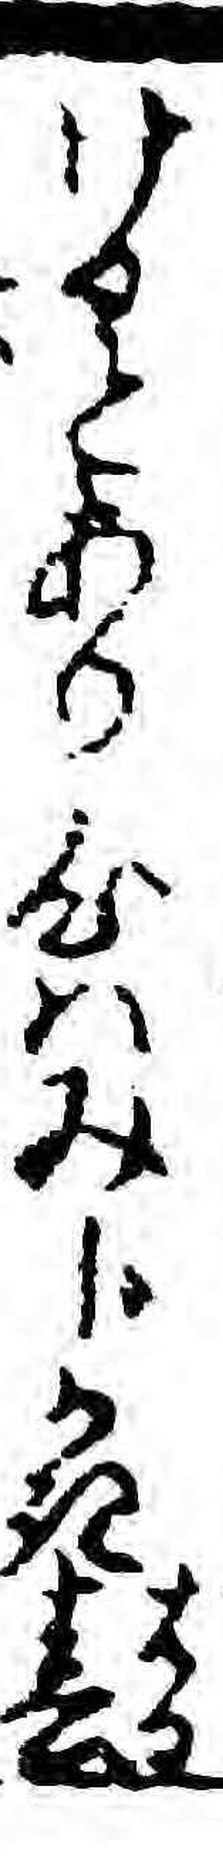けるとあり心はみじかき春
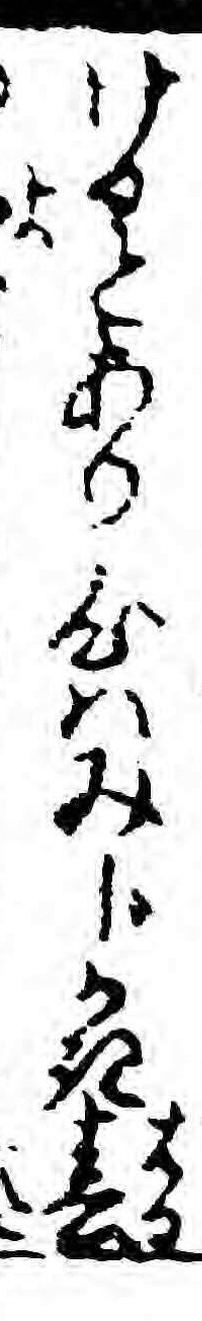けるとあり心はみじかき春
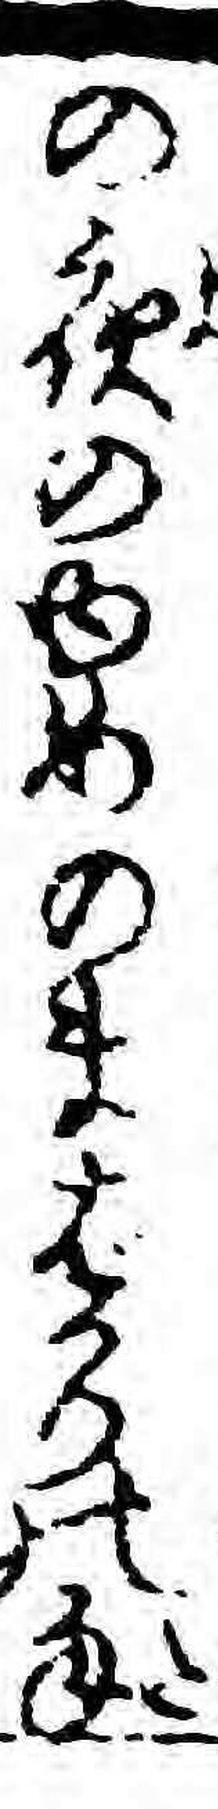の夜のゆめのまばかりの手
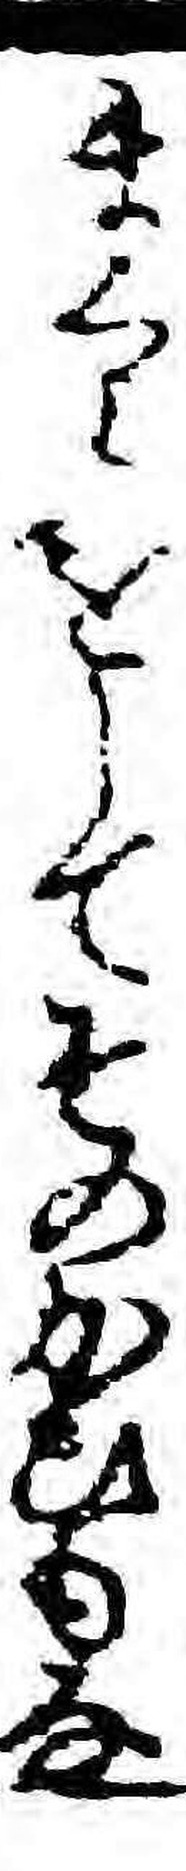まくらをしてそのかひもな
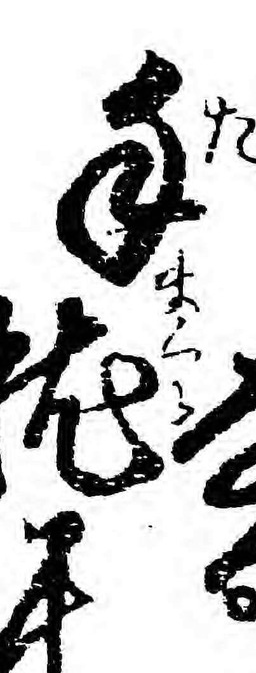手枕に
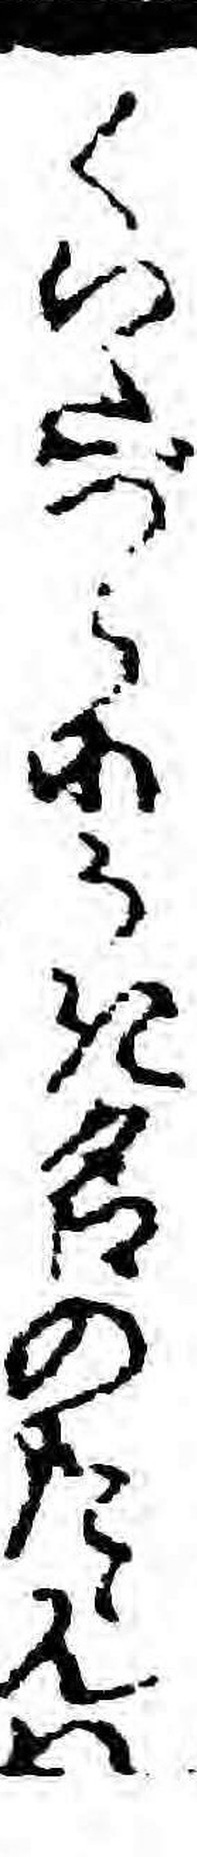くいたづらにうき名のたゝんは
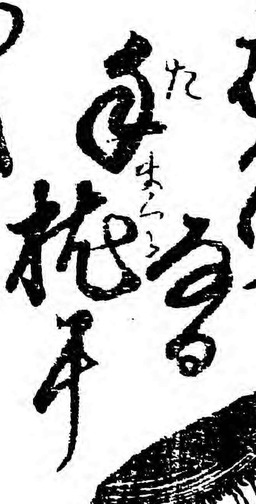手枕に
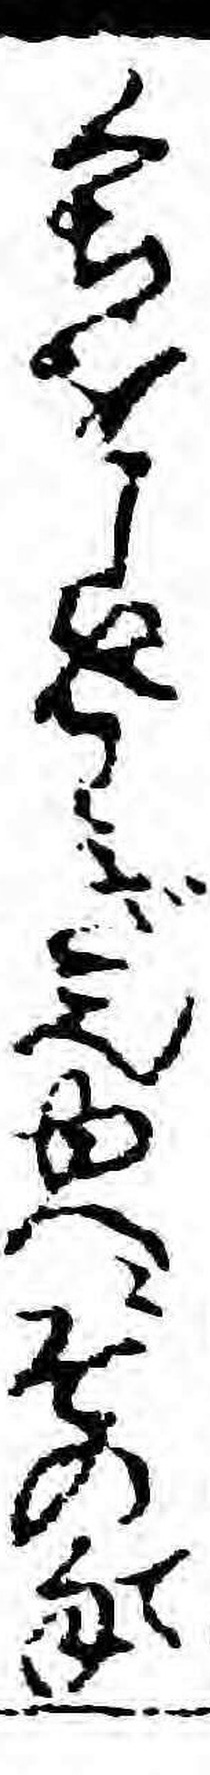くちをしきわざ也ゆへにその手
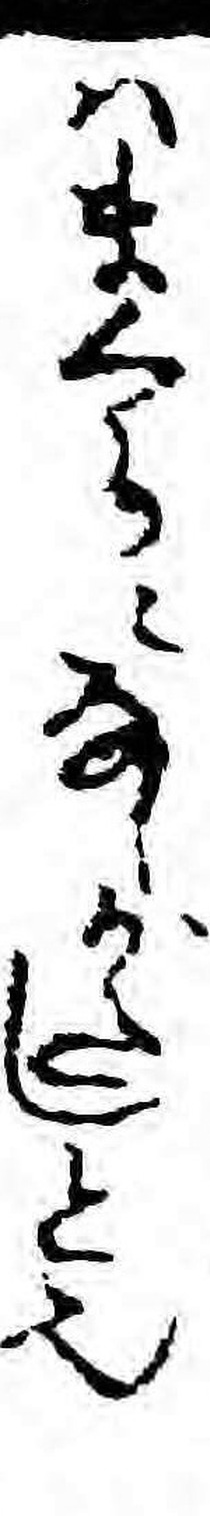はまくらになしがたしこと也
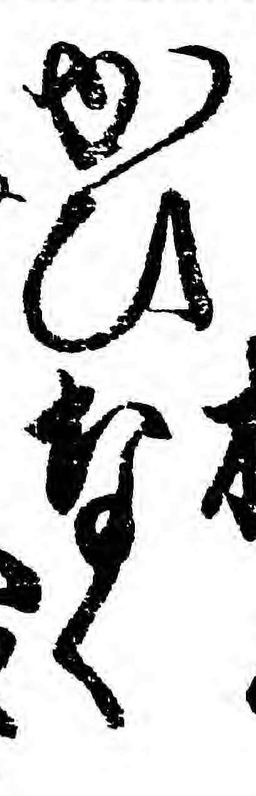かひなく
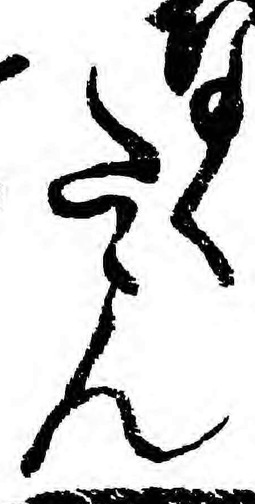たゝん

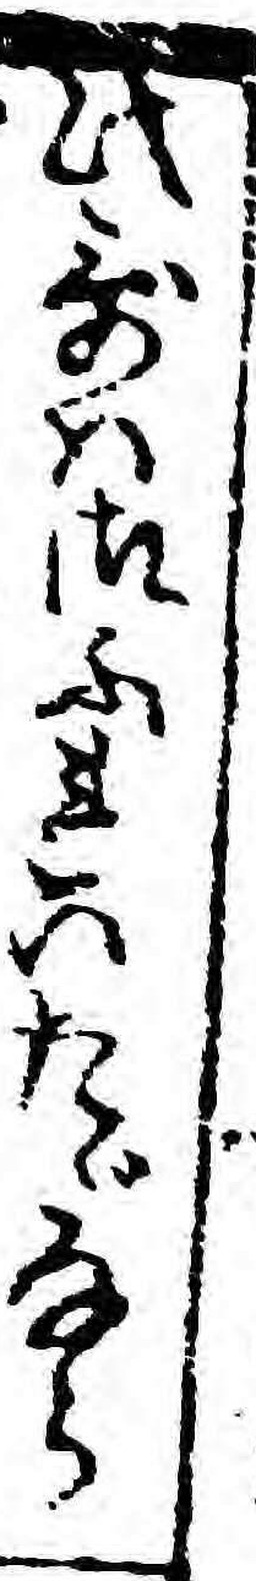此哥は御ふれいたゞなら
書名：頭書和歌注譯／壽賀多百人一首小倉錦
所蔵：国文学研究資料館
